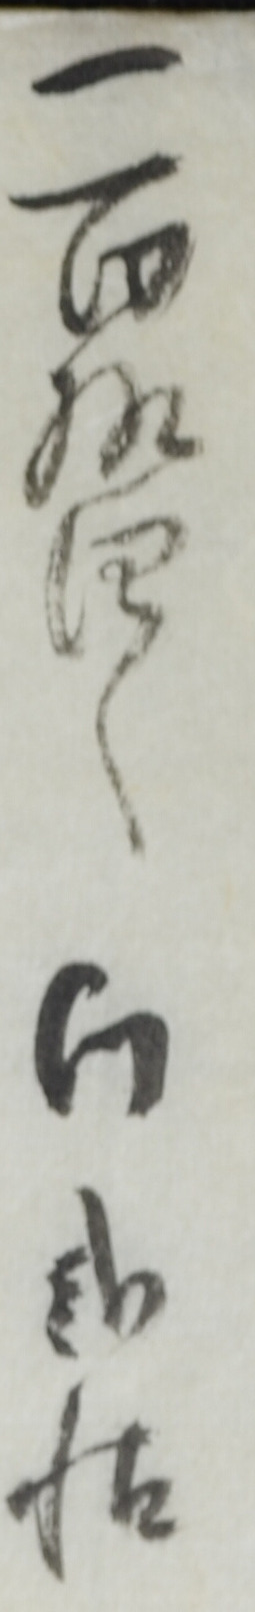一百拾四文同弐帖
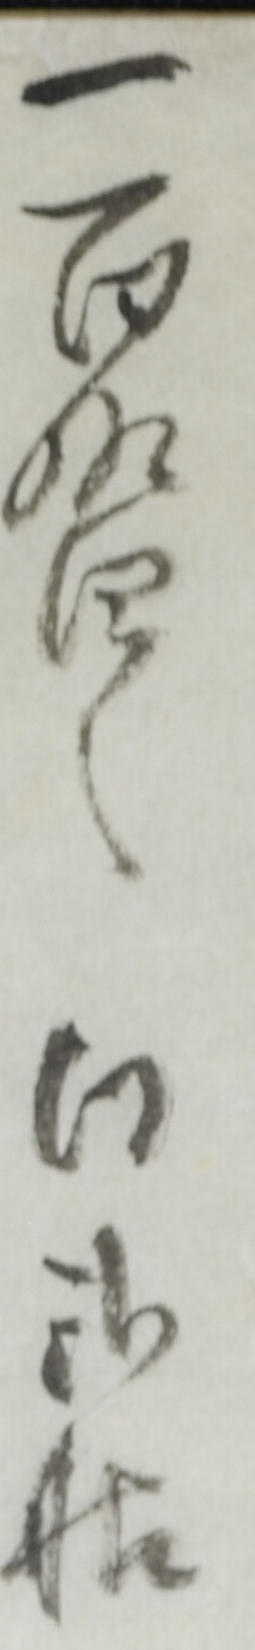一百拾四文同弐帖
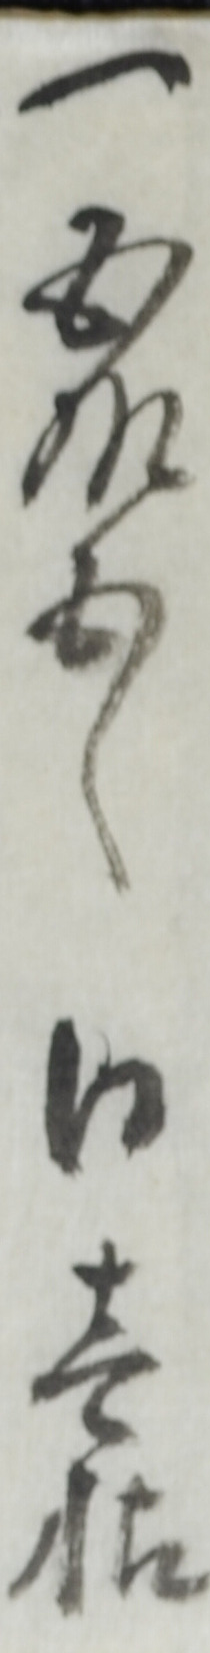一五拾五文同壱帖
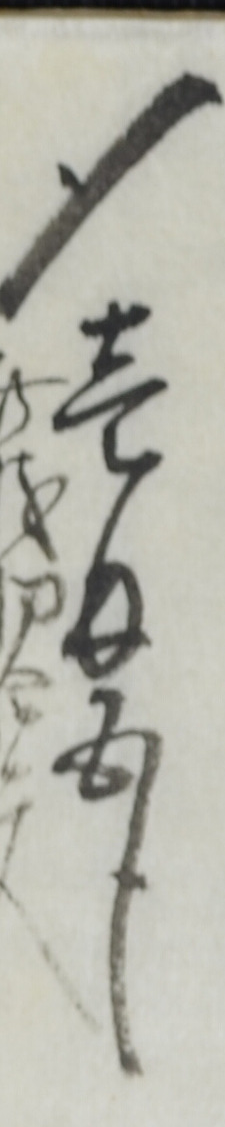〆壱匁五分
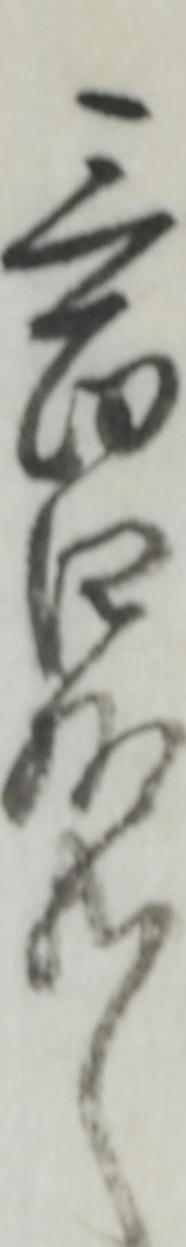三百四拾弐文
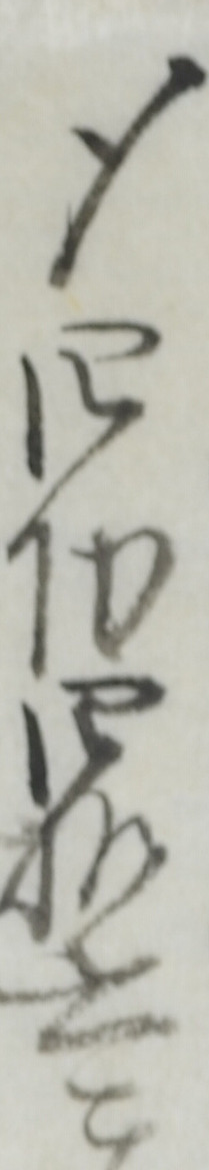〆四百四拾六文
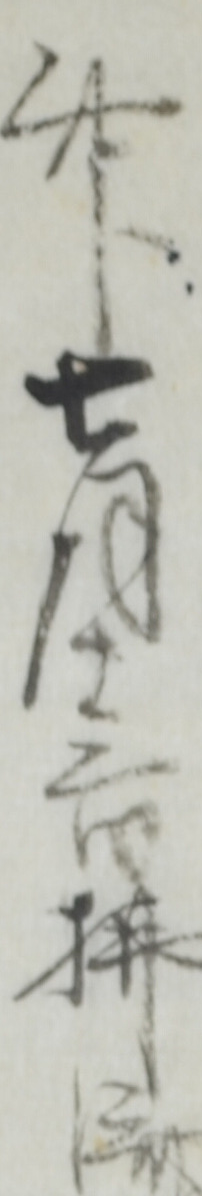此分七月十三日払済
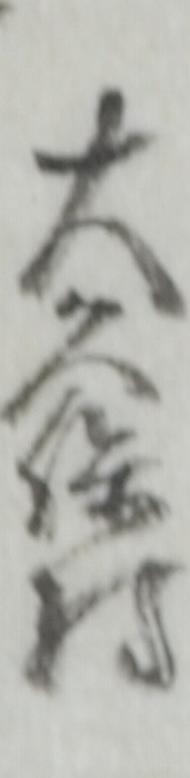大久保村
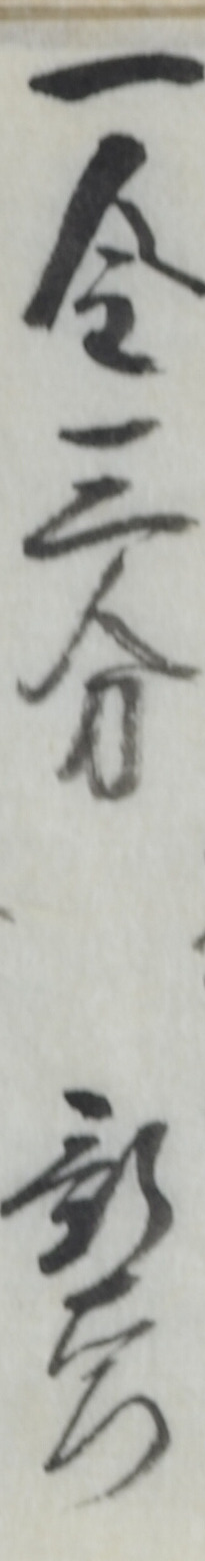一金三分新右衛門
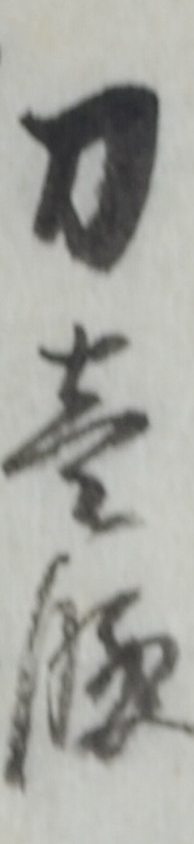刀壱腰
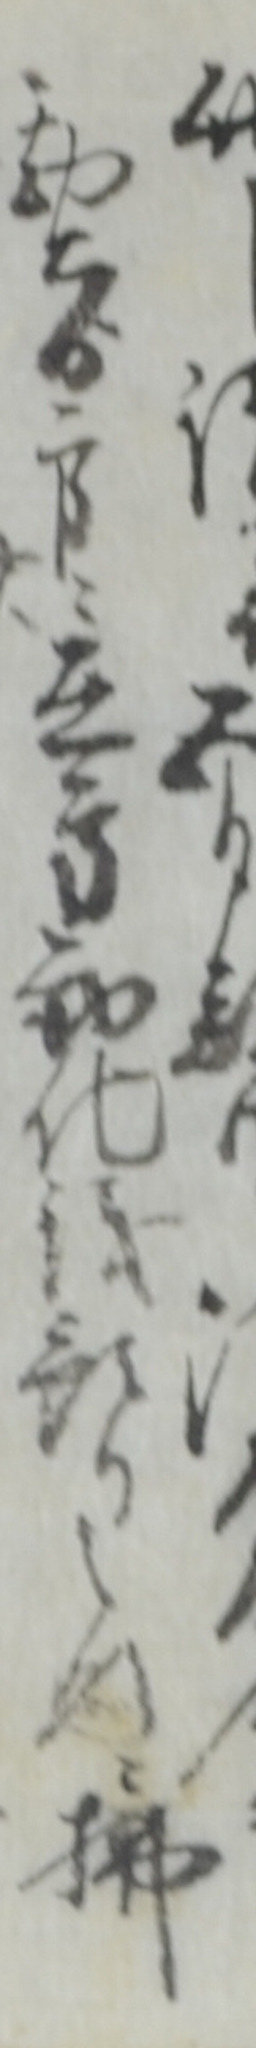勘右衛門方ニ在方勧化銭預り之内ニ払
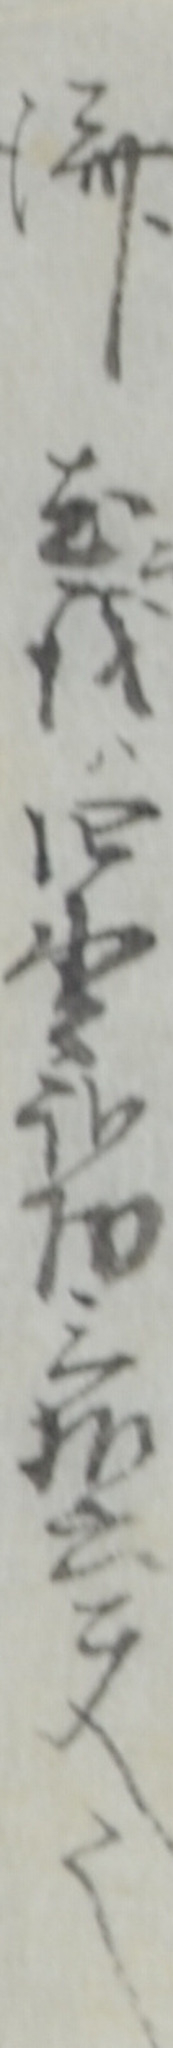済尤此銭ハ四貫弐百三拾六文也

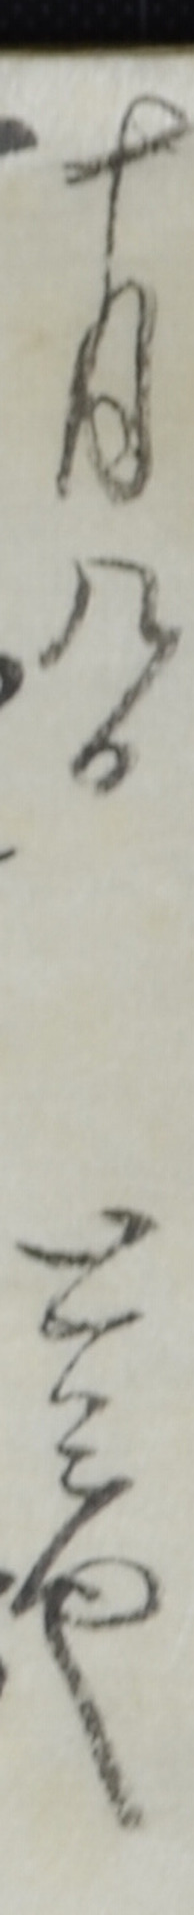十月八日とミや
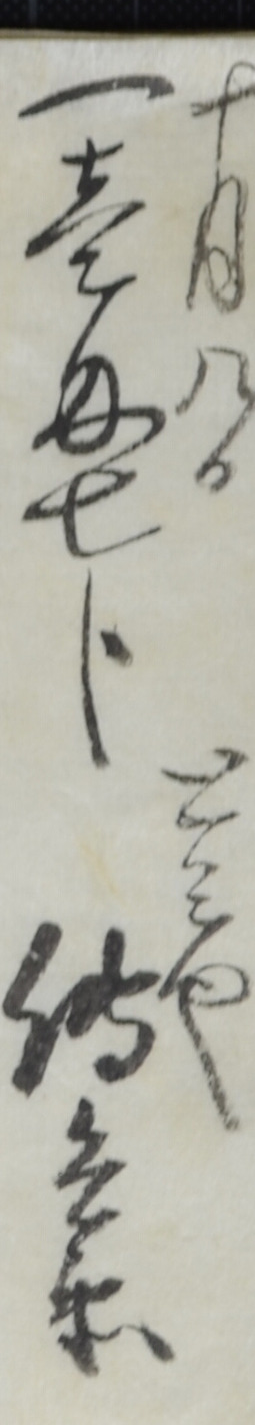一壱匁七分伝兵衛
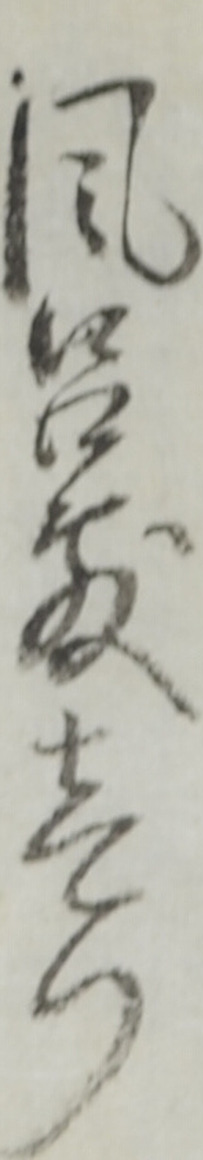風呂敷壱ツ
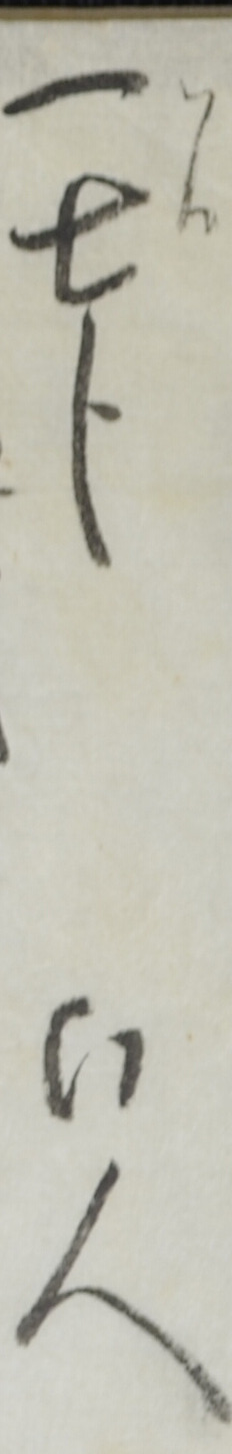一七分同人
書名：権現勧化入用勘定帳
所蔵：伊那市立高遠町図書館・合同会社AMANE
